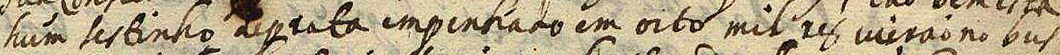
hum sestinho de prata empenhado em oito mil res̄ uieraõ no bus
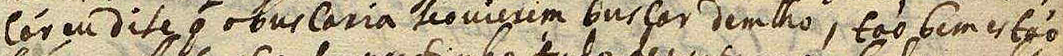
Car eu dise q̄ o busCaria se o uierem busCar demlho, taõbem estaõ
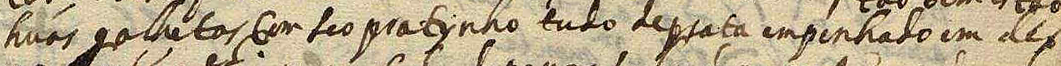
huās galhetas Com seo pratynho tudo de prata empenhado em des
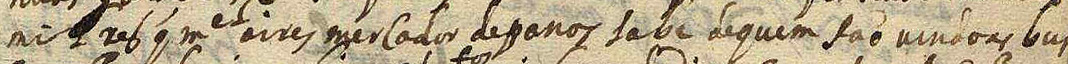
mil res̄ q̄ meL aires merCador de panos sabe de quem saõ uindo as bus
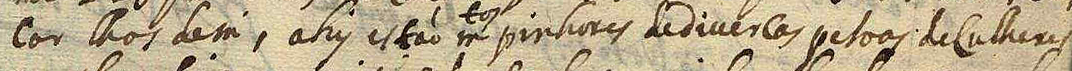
Car lhos dem, ahy estaõ mtos pinhores de diuerCas pesoas de Culheres
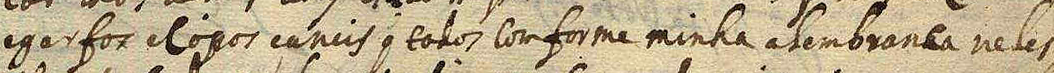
e garfos e Copos e aneis q̄ todos Conforme minha aLembranca neles
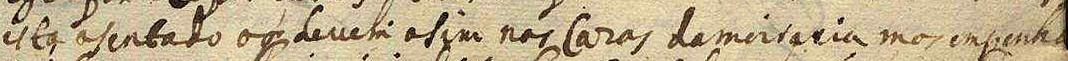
esta asentado o q̄ deuem asim nas Cazas da moiraria mos empenha
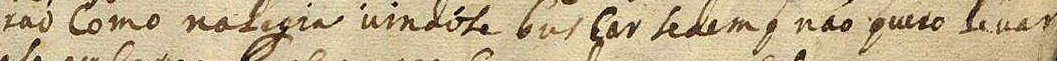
raõ Como na Logia uindose busCar se dem q̄ naõ quero Leuar
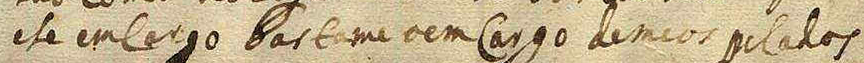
e se emCargo bastame o emCargo de meos peCados.
